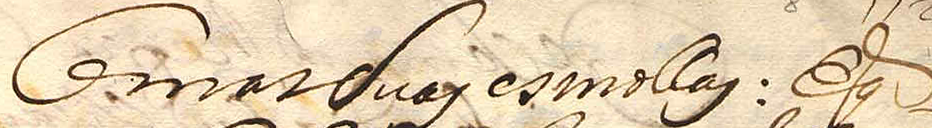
Com as Suas esmollas: E q̄
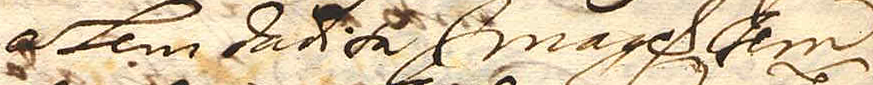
alem da dita Jmagē tem
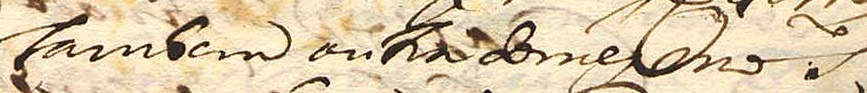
tambem outra do mesmo Sto
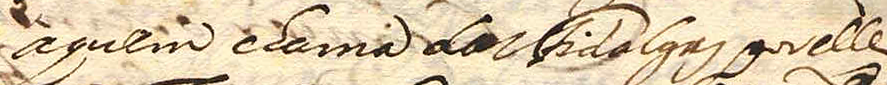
a quem chama das Fidalgas por elle
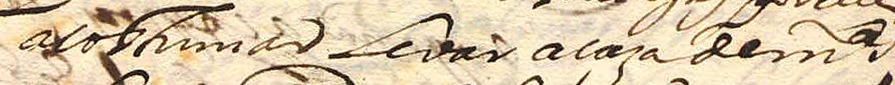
acostumar Levar a caza de mtas
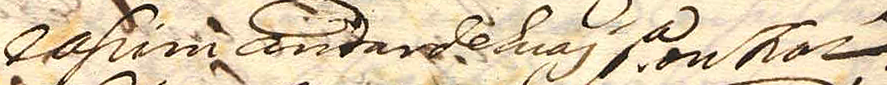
e assim contar de huas p.a outras
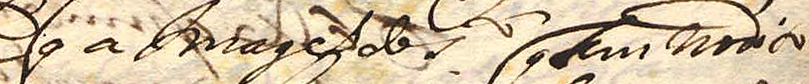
E q̄ a Jmagē do S.to q̄ tem no dito
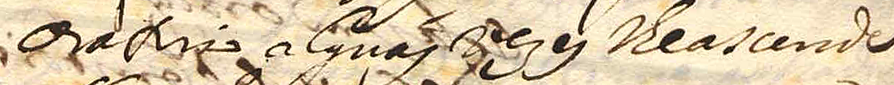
oratorio alguās vezes lhe ascende
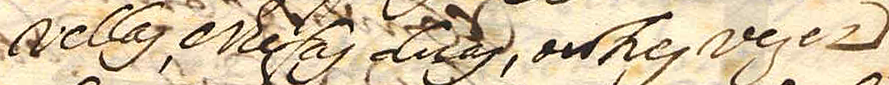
vellas, e lhe fas duas, ou tres vezes
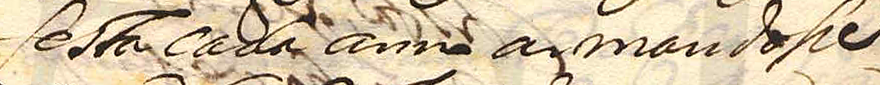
festa cada anno armandosse
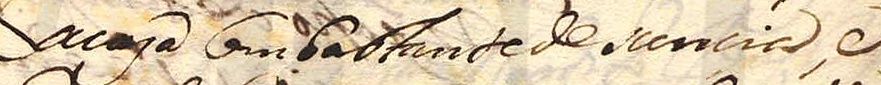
a caza com bastante descençia, e
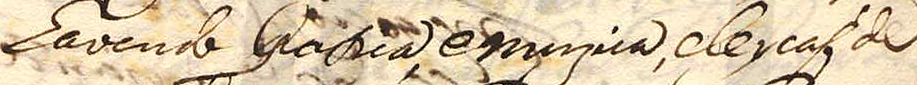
havendo pratica, e muzica, eleycaõ de
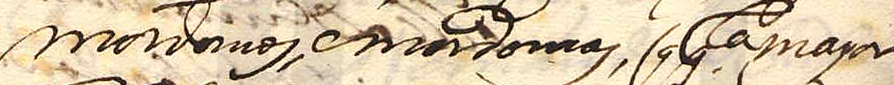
mordomos, e mordomas, q̄ p.la mayor
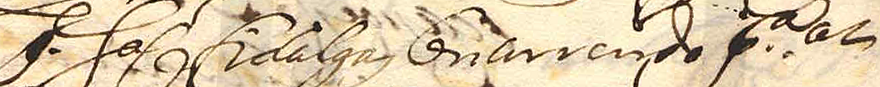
p.te Saõ fidalgas Concorrendo p.a as
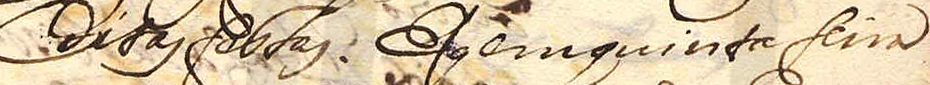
ditas festas. E q̄ em quinta feira
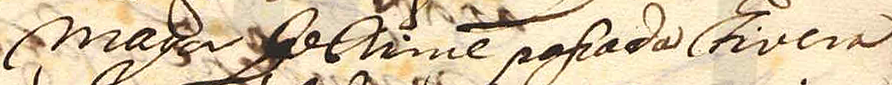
mayor proxime passada tivera
